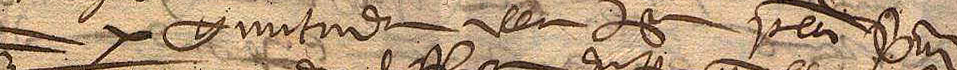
item ꝑguntada ella tsa p̄llo p̄mro
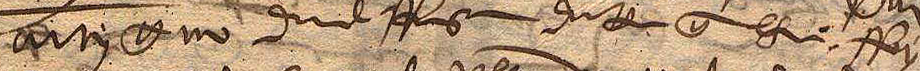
artyguo da deffesa da Re q̄ lhe ffoy
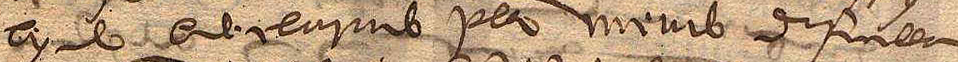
lydo e declarado p̄llo meudo dise ella
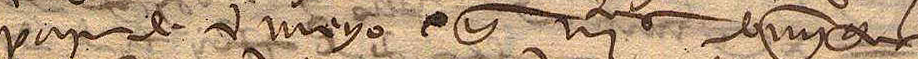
parede ē meyo e q̄ mtos dom̄jgos
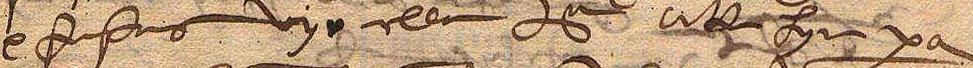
e festas vyo ella tsa a Re hyr ꝑ a
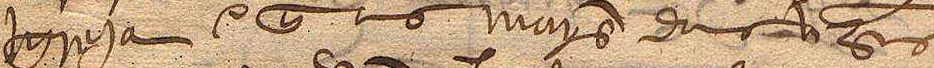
Jgreja e q̄ as mays das vezes
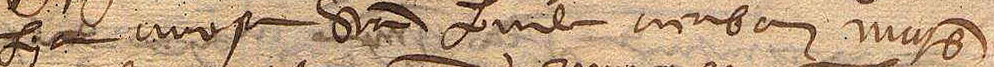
hya a nosa Srā honde acabam majs
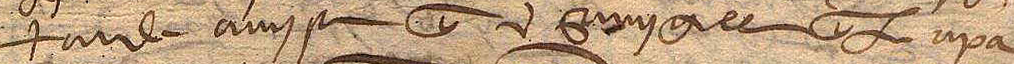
tarde a mjsa q̄ ē samjgel q̄ he a pa
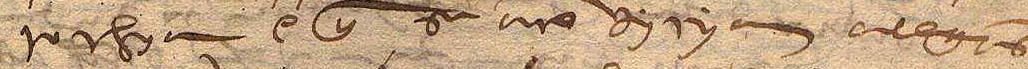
rochya e q̄ se ācotycyam allguās
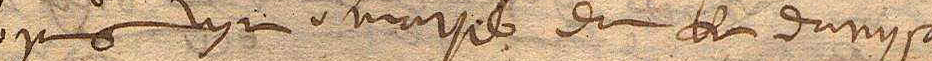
oras vyr o marjdo da Re da mjsa
